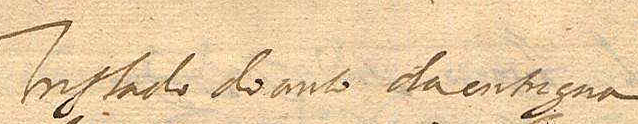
Treslado do auto da entregua
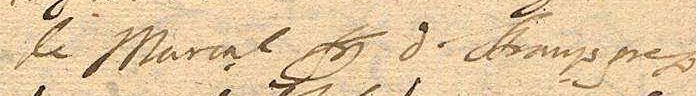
de Marçal fr̄z d Araujo preso
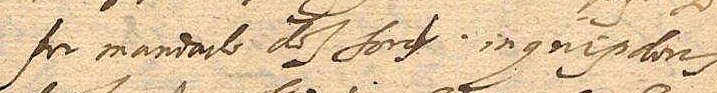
por mandado dos sorēs inquisidores
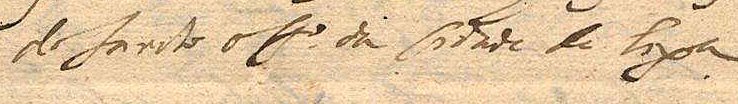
do santo offo da Cidade de lixa.
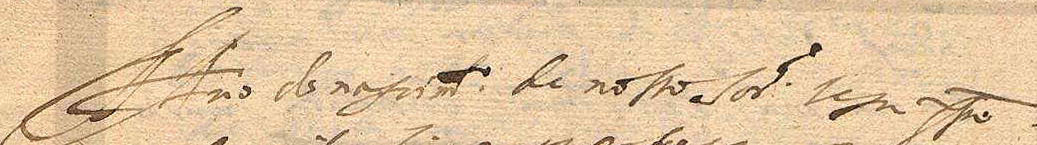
Ano do nasimto. de nosso sor̄. Iesu X̄po
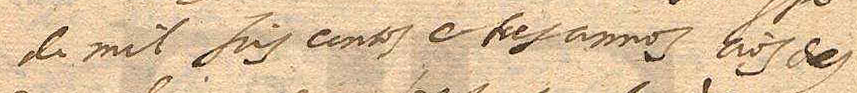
de mil seiscentos e tres annos aos dez
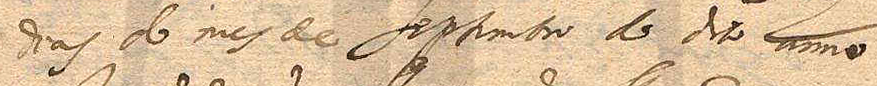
dias do mes de septembro do dito anno
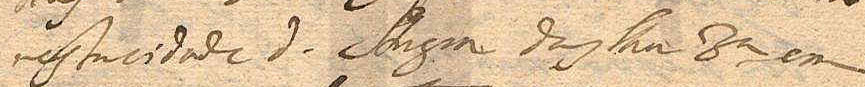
nesta cidade d. Angra da jlha 3a em
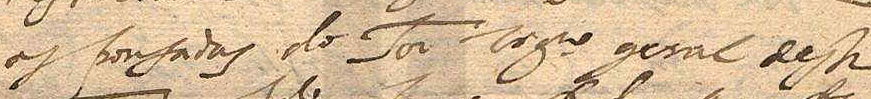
as pousadas do S̄or Vigr.o geral deste
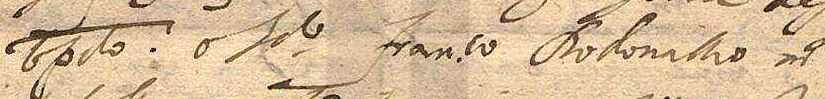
b̄pdo. o Ldo fran.co Rodoualho m.tre
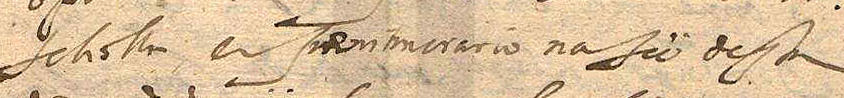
Scholla e pœnitenciario na seé desta
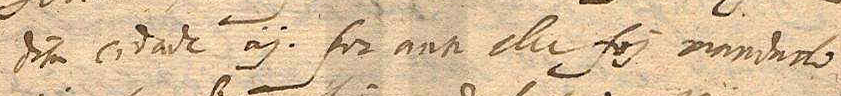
dita cidade aj perante elle foj mandado
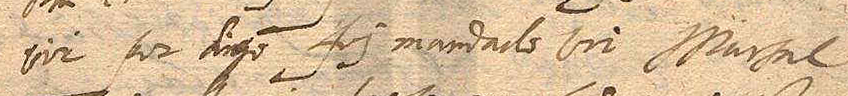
vir por digo foj mandado vir Marsal
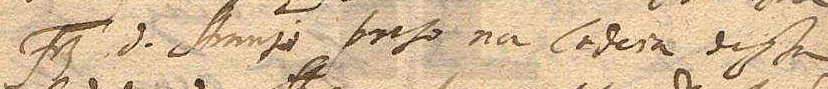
F̄rz, d. Araujo preso na Cadeia desta
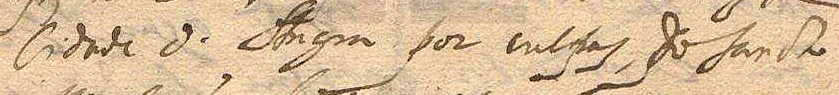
Cidade d. Angra por culpas, do sancto
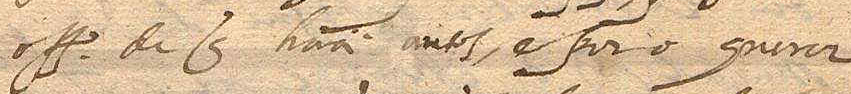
off.o de q̄ hāa autos, e por o querer
